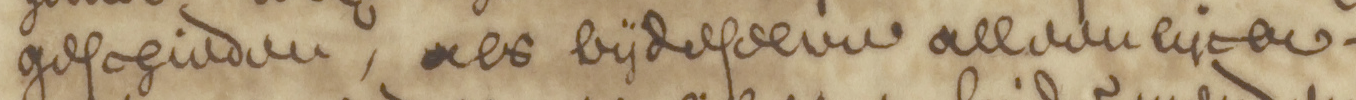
geschieden, als bijdeselve alleenlijck
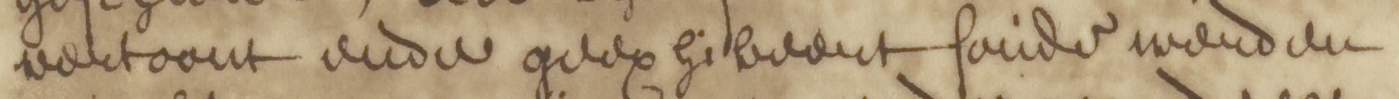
vertoont ende geexhibeert soude werden
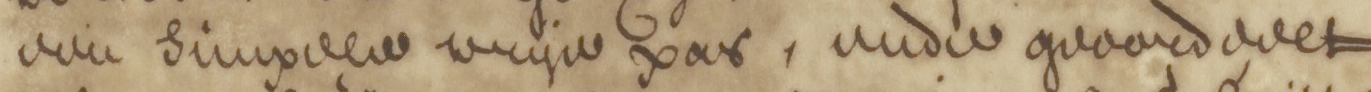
een simpele vrije pas, ende geoordeelt
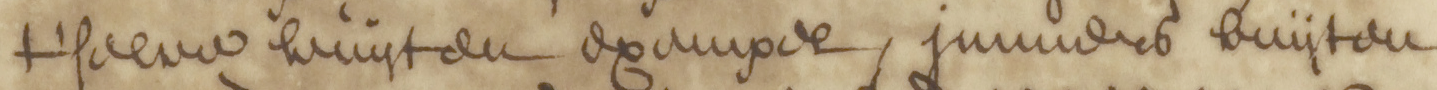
t'selve buijten exempel, immers buijten
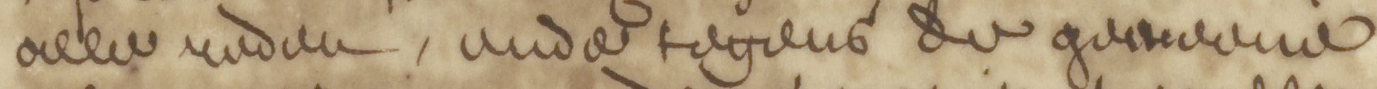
alle reden, ende tegens de gemeene
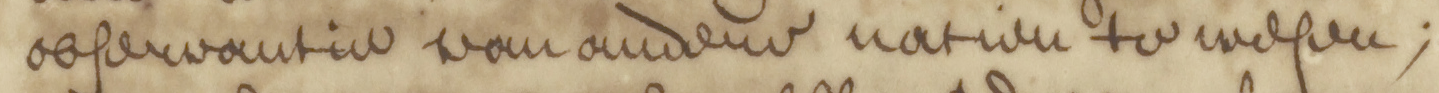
observantie van andere natien te wesen;
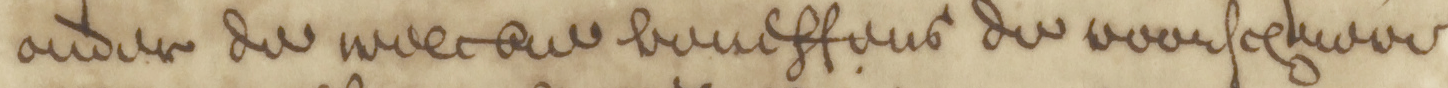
onder de welcke beneffens de voorschreve
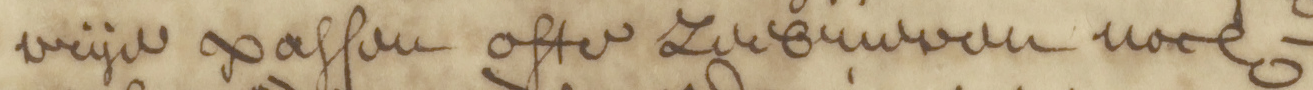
vrije passen ofte zeebrieven noch
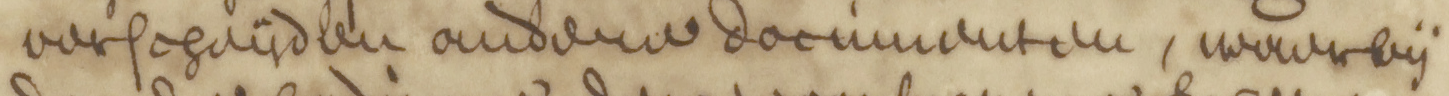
verscheijden andere documenten, waerbij
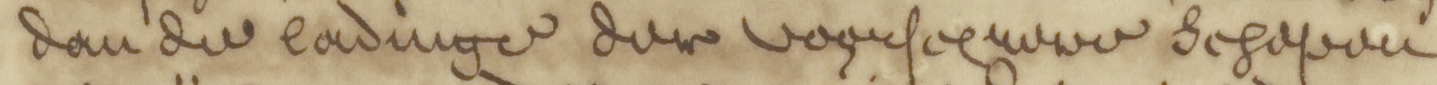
dan de ladinge der voorschreve schepen
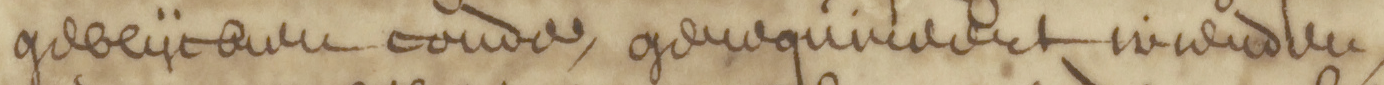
geblijcken conde, gerequireert wierden
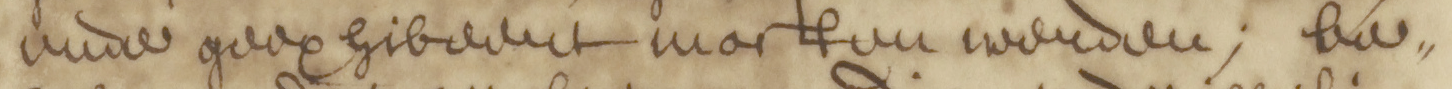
ende geexhibeert mosten werden; be,,
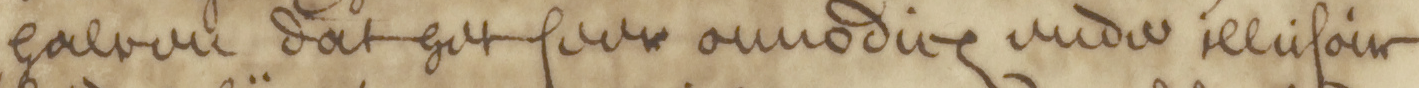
,,halven dat het seer onnodich ende illusoir
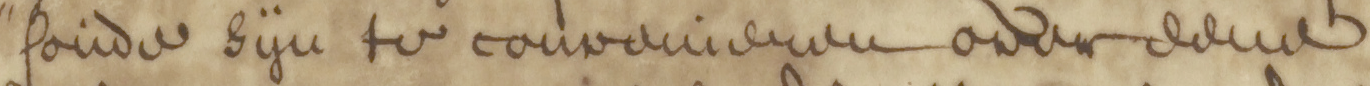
soude sijn te convenieren over eene
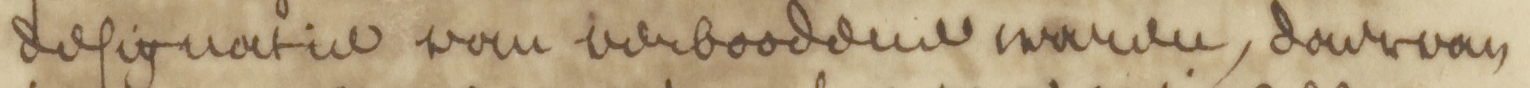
designatie van verboodene waren, daervan
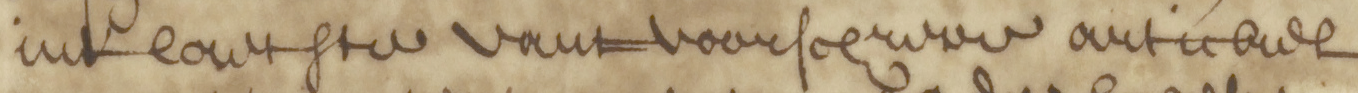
int laetste vant voorschreve artickel
